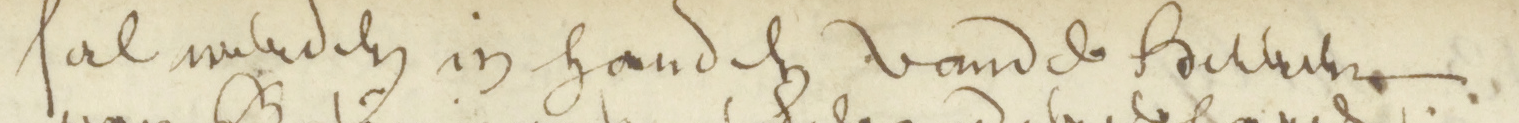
sal werden in handen vande Heeren
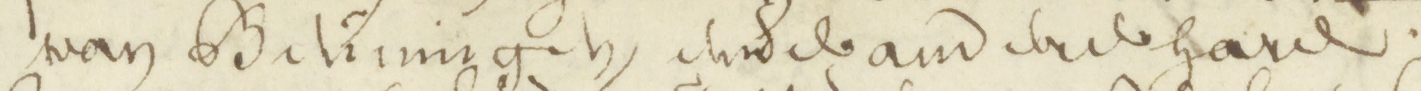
van Beuningen, ende andere hare
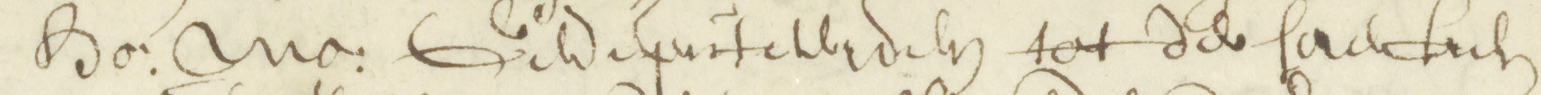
Ho:Mo: Gedeputeerden tot de saecken
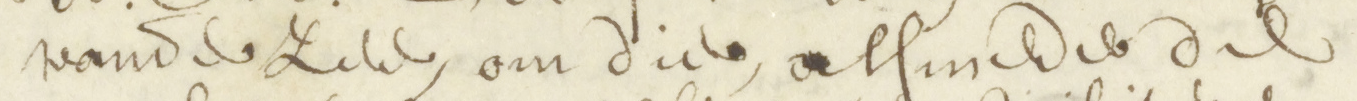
vande Zee, om die, alsmede de
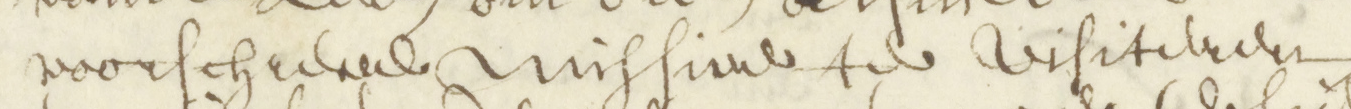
voorschreve missive te visiteren,
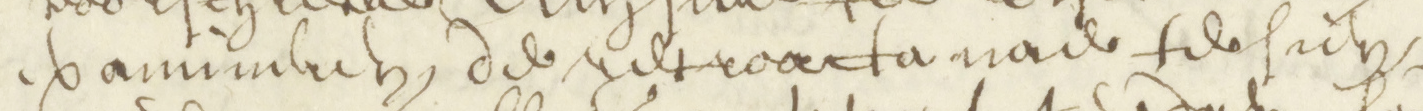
examineren, de retroacta nae te sien,
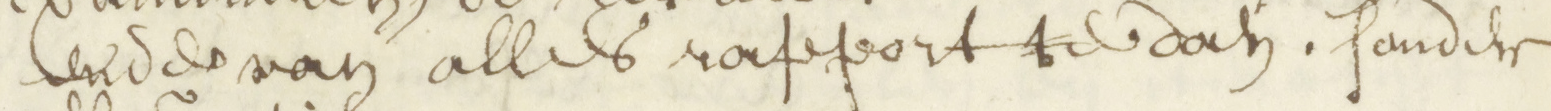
ende van alles rapport te doen, sonder
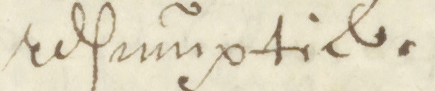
resumptie.
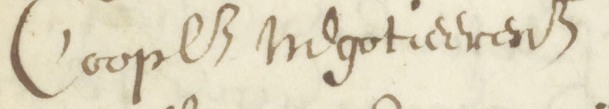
Coopl. negotieeren
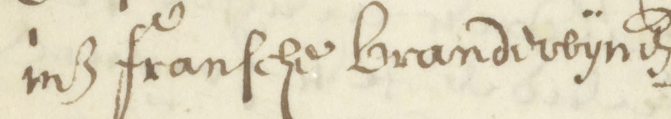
in Fransche Brandewijnen
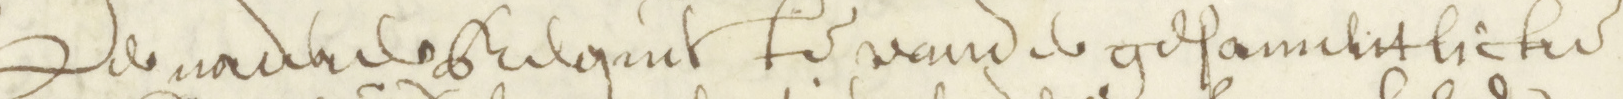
De nadere Requeste vande gesamentlicke
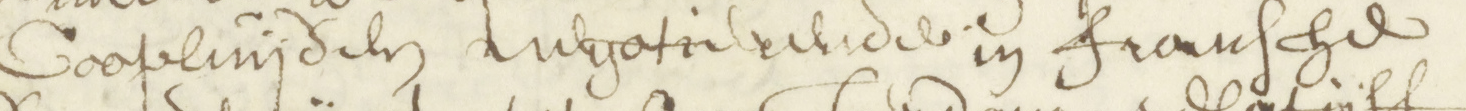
Coopluijden negotierende in fransche
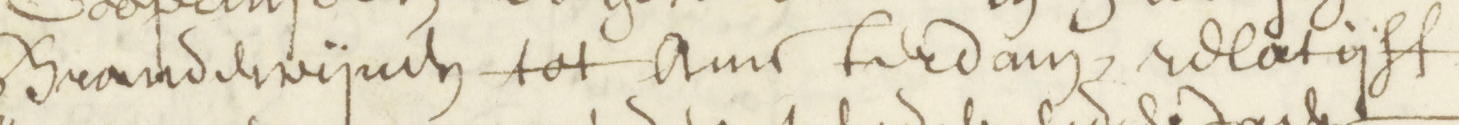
Brandewijnen tot Amsterdam, relatijff
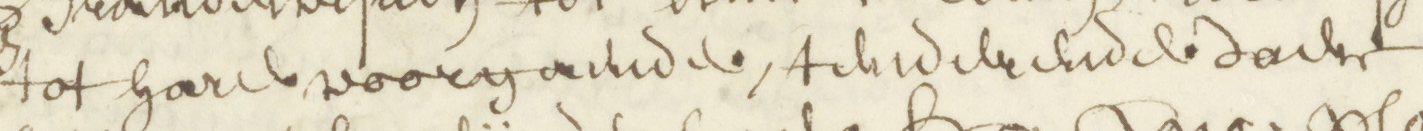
tot hare voorgaende, tenderende daer
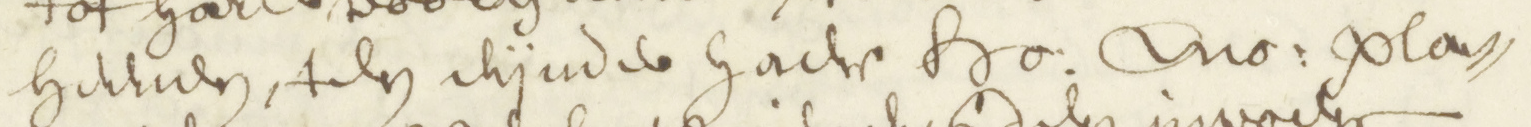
heenen, ten eijnde haer Ho:Mo: pla„
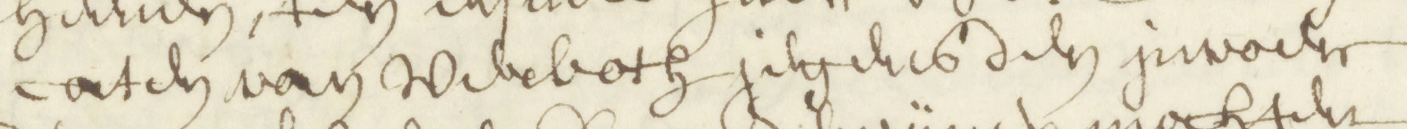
caten van Verboth jegens den invoer
